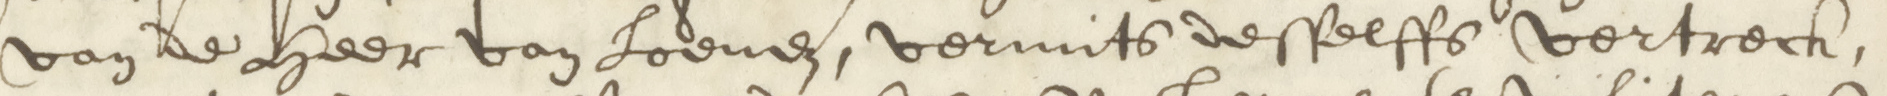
van de heer van Loenen, vermits desselffs vertreck,
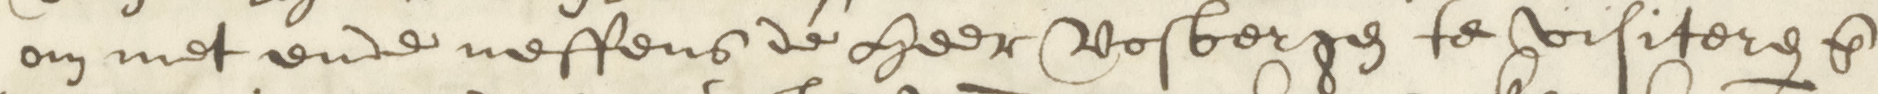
om met ende neffens de heer Vosbergen te visiteren &
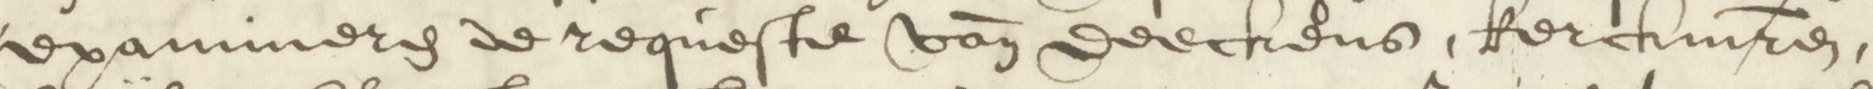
examineren de requeste van Deeckens, Kerckmren,
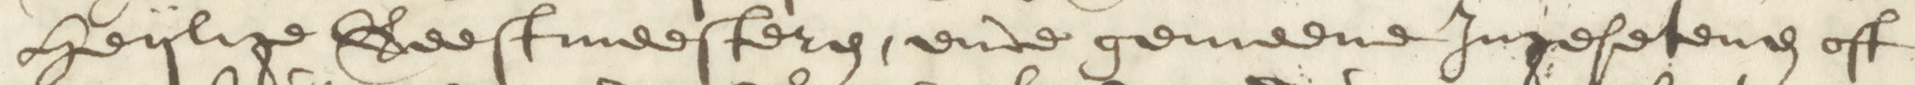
Heijlige Geestmeesteren, ende gemeene Ingesetenen oft
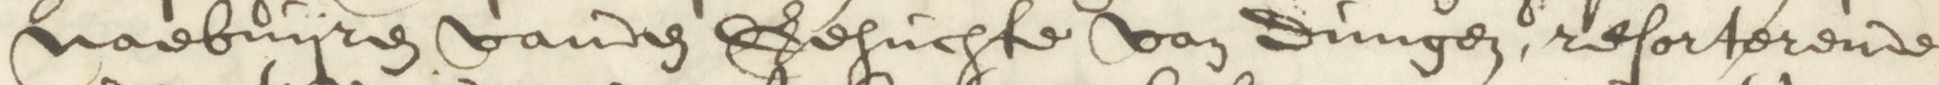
Naebuijren vanden Gehuchte van Dungen, resorterende
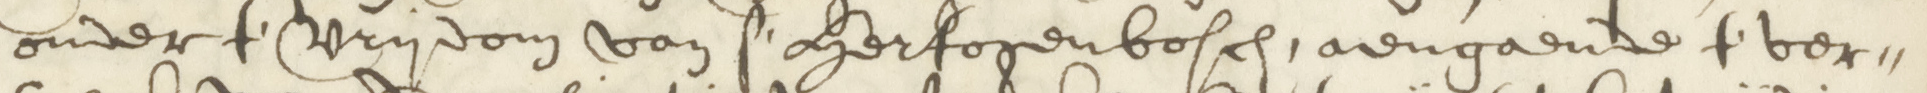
onder t‛ Vrijdom van s‛Hertogenbosch, aengaende t‛ ver„
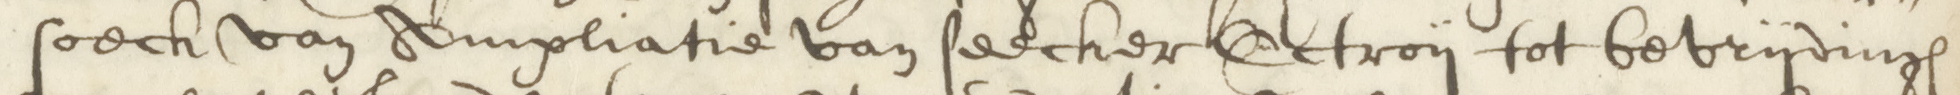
soeck van Ampliatie van seecker Octroij tot bevrijdingh
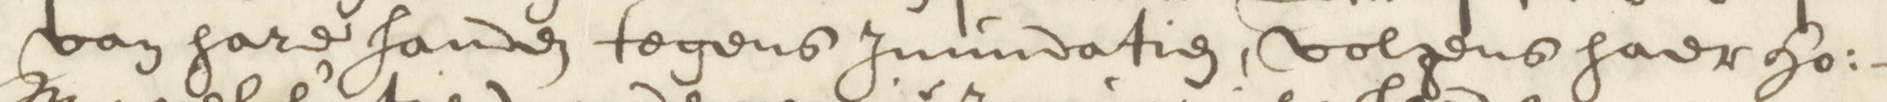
van hare Landen tegens Inundatien, volgens haer Ho:
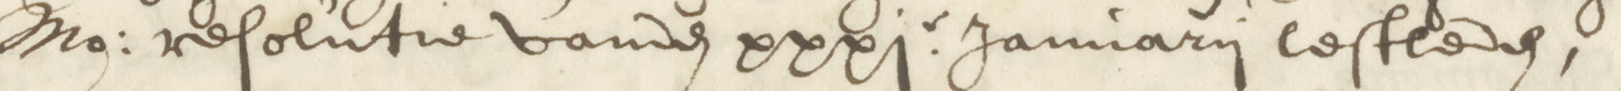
Mo: resolutie vanden XXXIe Januarij lestleden
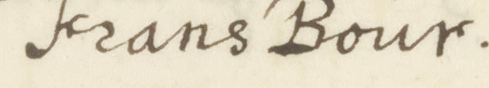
Frans Bour.
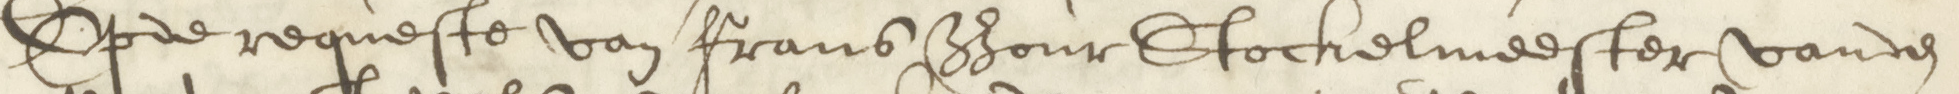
Opde requeste van Frans Bour, Stockelmeester vanden
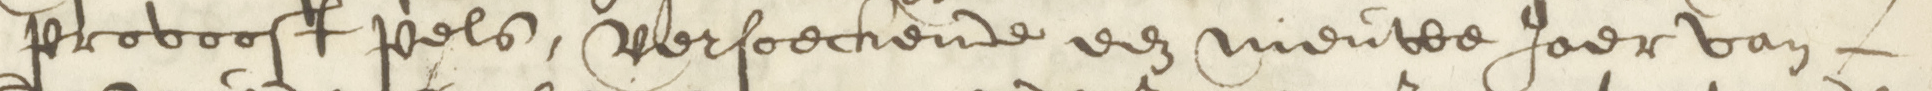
provoost pels, versoeckende een nieuwe jaer van —
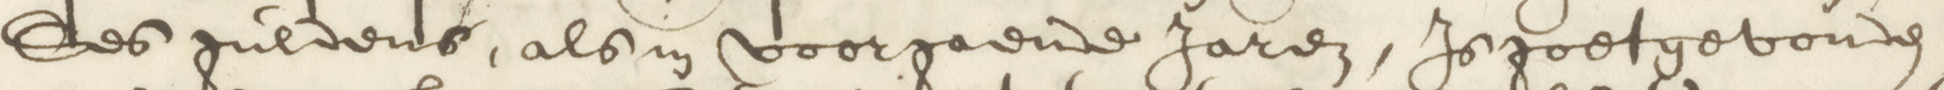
ses guldens, als in voorgaende jaren, Is goetgevonden
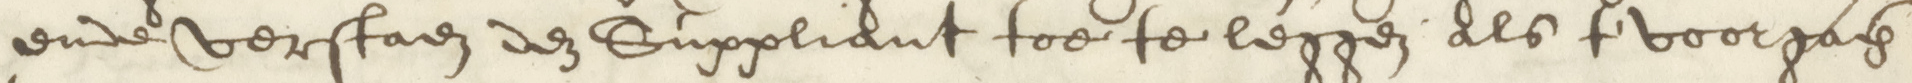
ende verstaen den Suppliant toe te leggen als t‛voorgae
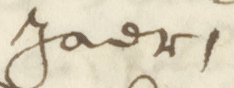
jaer.
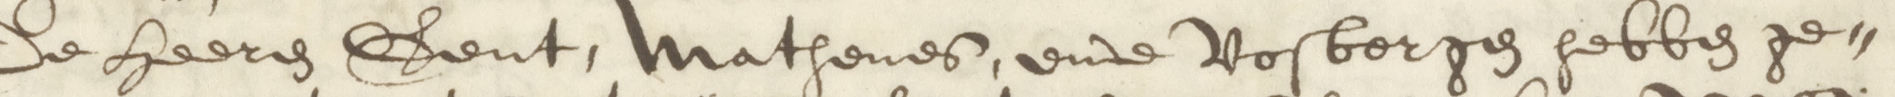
De heeren Gent, Mathenes, ende Vosbergen hebben ge„
